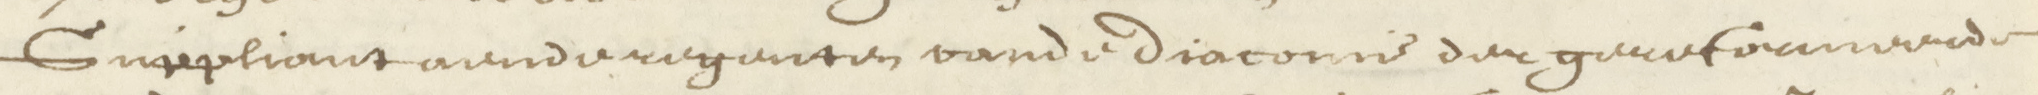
Suppliant aende regenten vande diaconie der gereformeerde
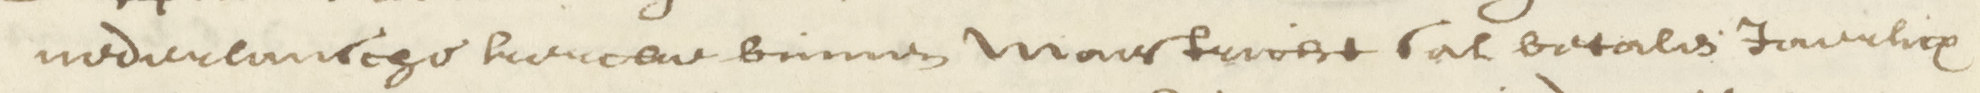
nederlansche kercke binnen Maestricht sal betalen Jaerlicx
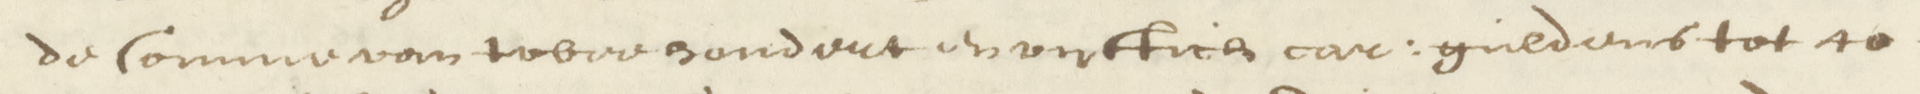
de somme van twee hondert en vyftich car: guldens tot 40
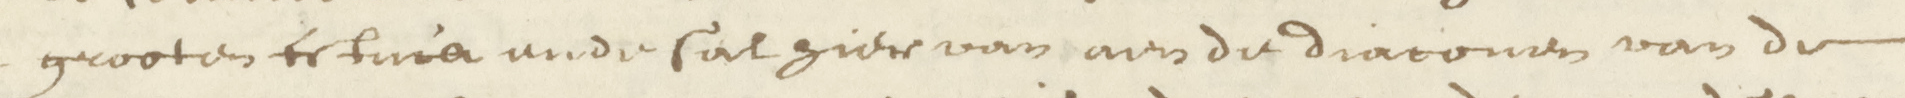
grooten tstuck ende sal hier van aen de diaconen van de
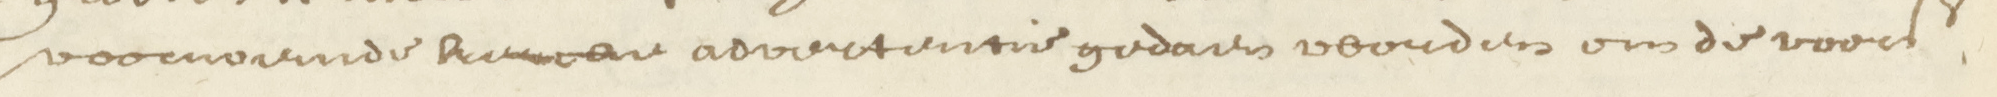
voornoemde kercke advertentie gedaen worden om de voors.
